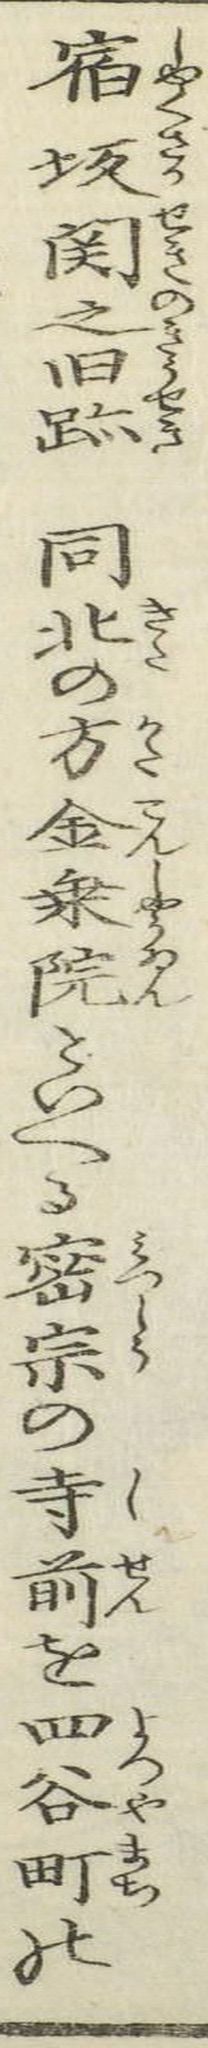宿坂関旧跡同北の方金乗院といへる密宗の寺前を四谷町の
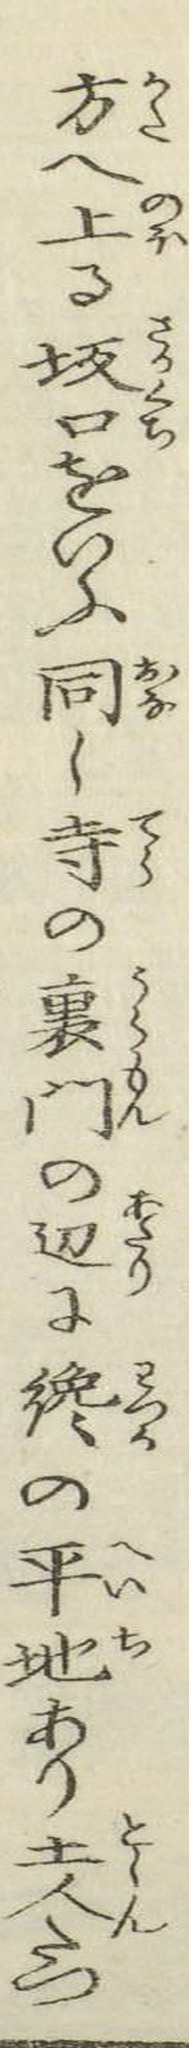方へ上る坂口をいふ同し寺の裏門の辺に纔の平地あり土人たつ
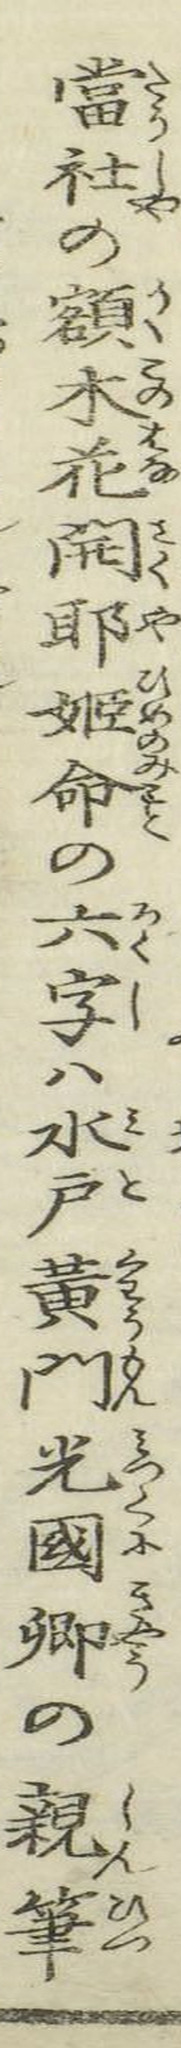當社の額木花開耶姫命の六字は水戸黄門光國卿の親筆
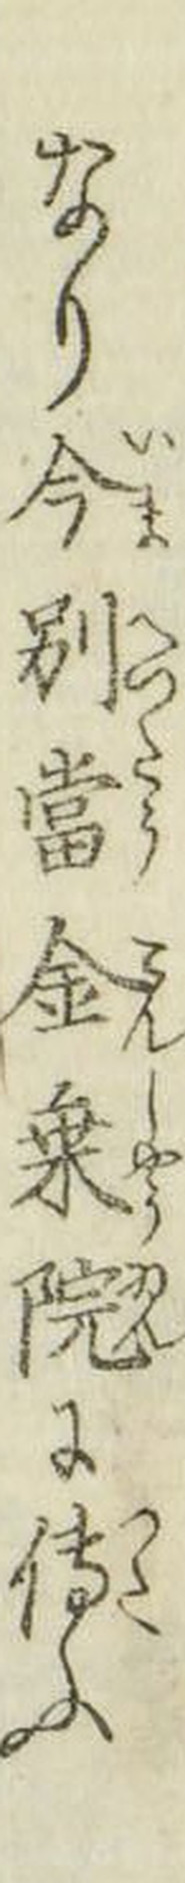なり今別當金乗院に傳ふ
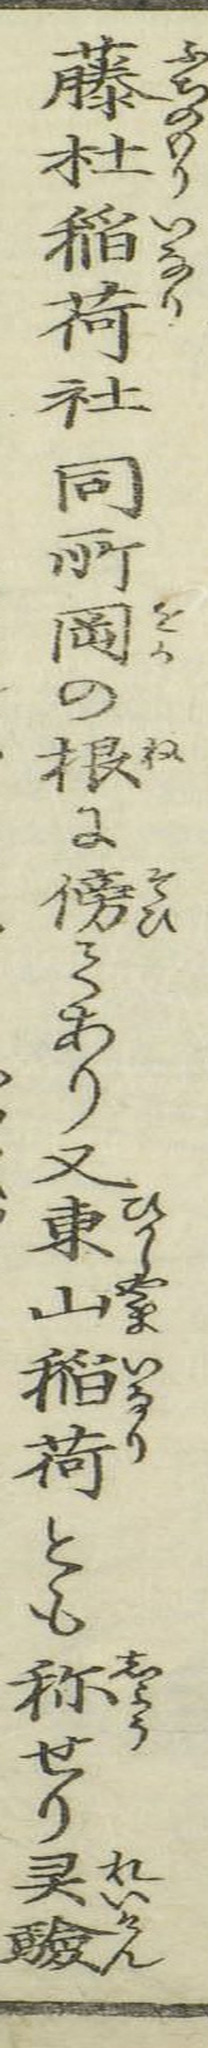藤杜稲荷社同所岡の根に傍てあり又東山稲荷とも称せり霊驗
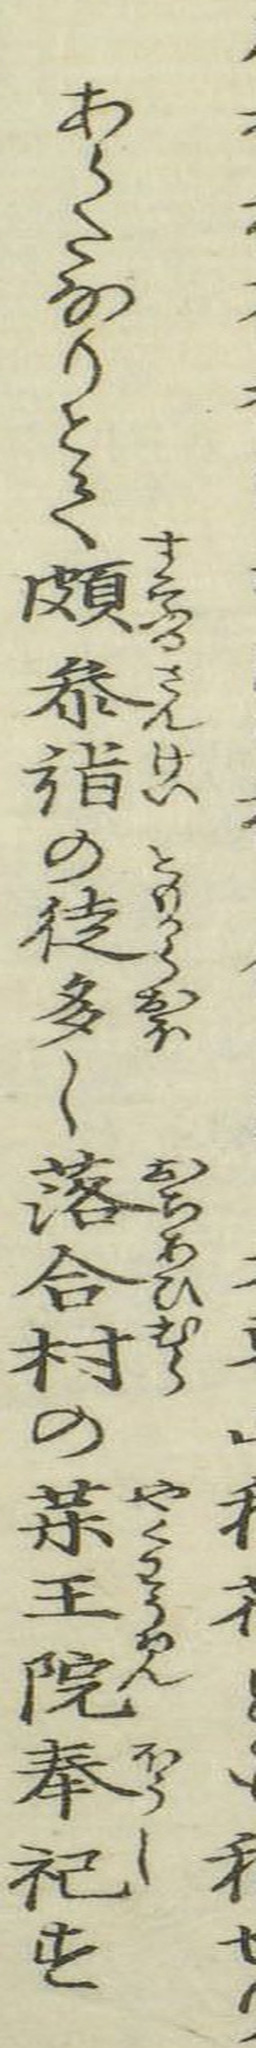あらたなりとて頗参詣の徒多し落合村の薬王院奉祀す

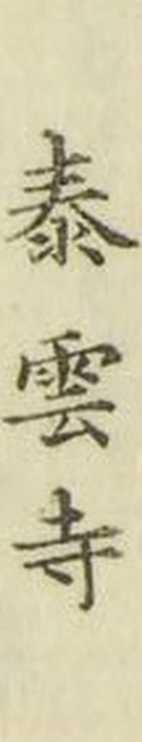泰雲寺
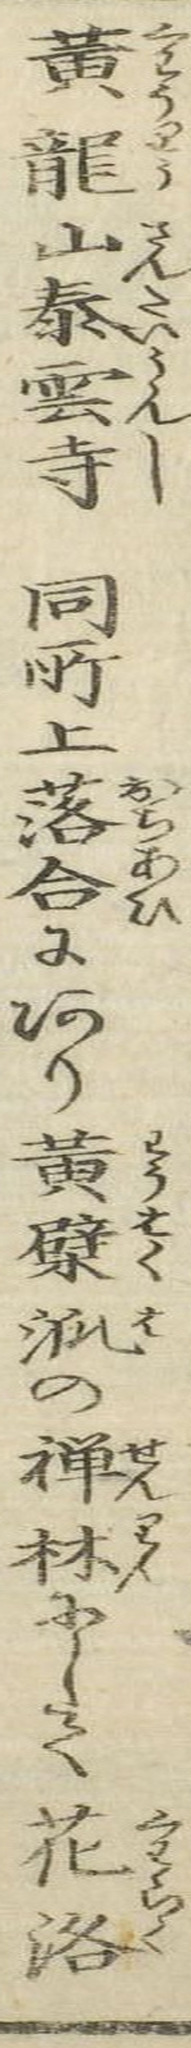黄龍山泰雲寺同所上落合にあり黄檗派の禅林にして花洛
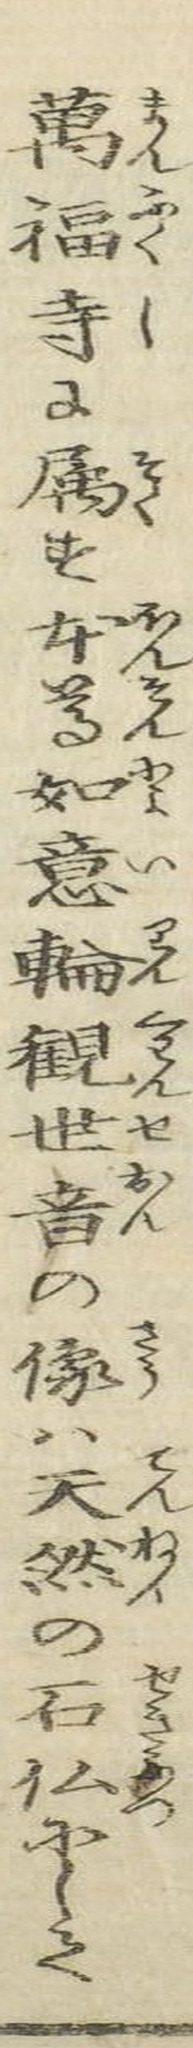萬福寺に属す本尊如意輪観世音の像は天然の石仏にして
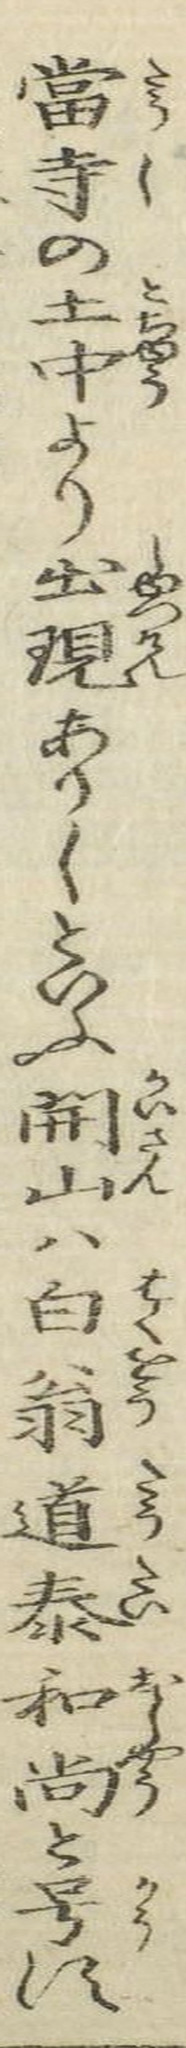當寺の土中より出現ありしといふ開山は白翁道泰和尚と号す
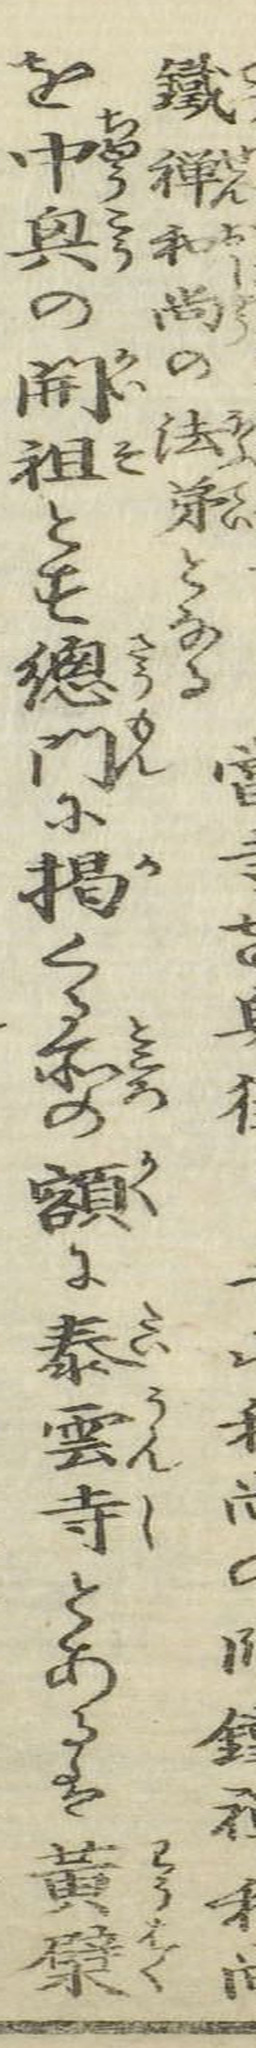を中興の開祖とす緫門に掲くる所の額に泰雲寺とあるは黄檗
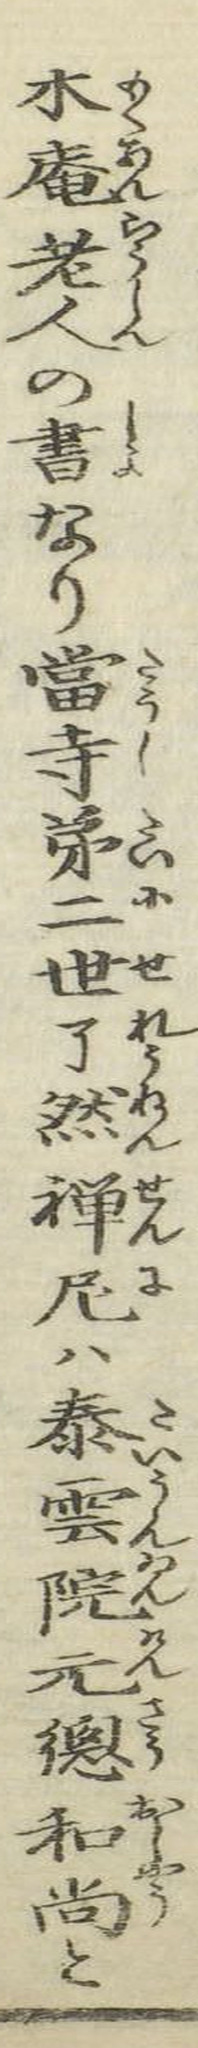木庵老人の書なり當寺弟二世了然禅尼は泰雲院元緫和尚と
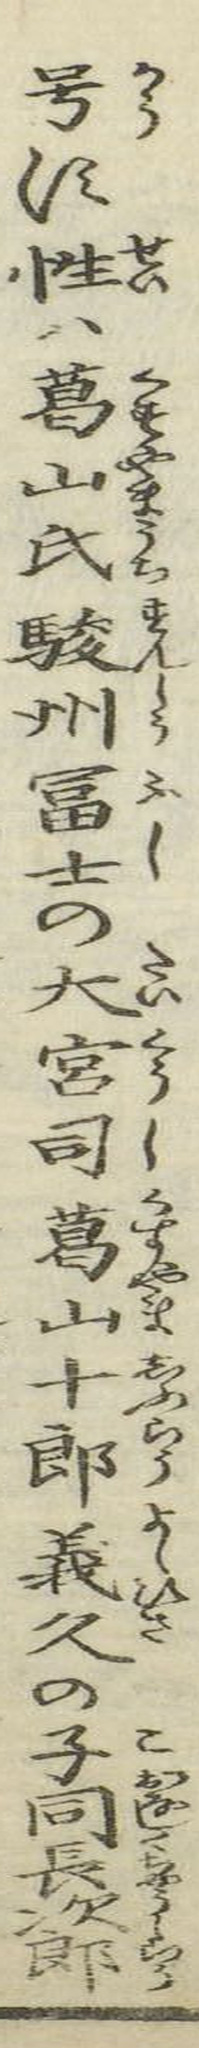号す性は葛山氏駿州冨士の大宮司葛山十郎義久の子同長次郎
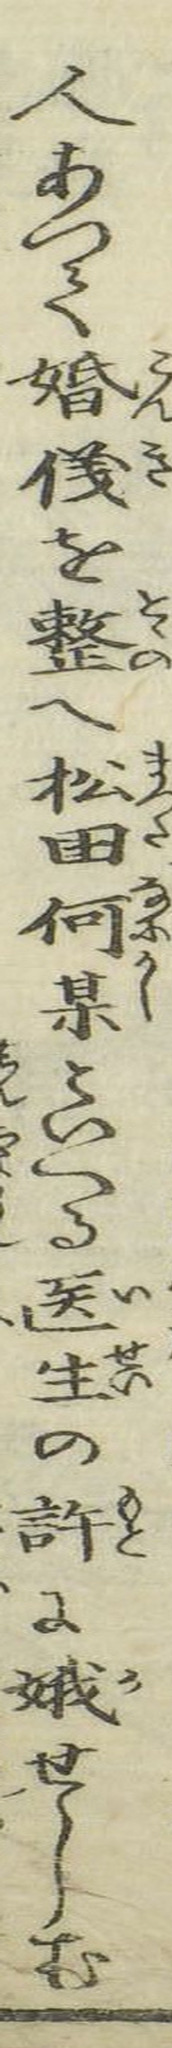人あつて婚儀を整へ松田何某といへる医生の許に娥せしむ

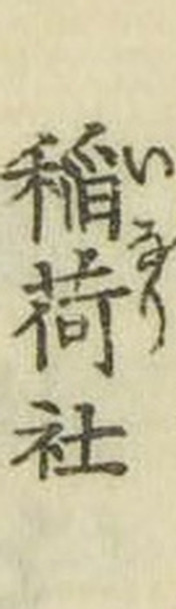稲荷社
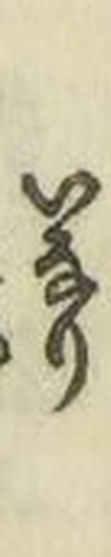いなり
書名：江戸名所図会 20巻 巻之12
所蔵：東京学芸大学教育コンテンツアーカイブ
